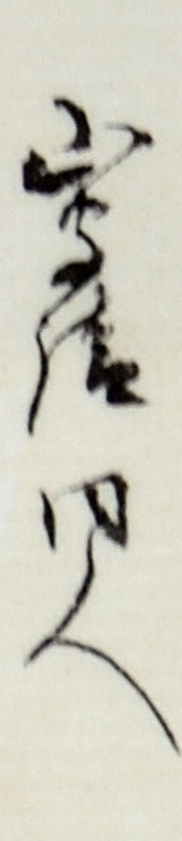山守請四人
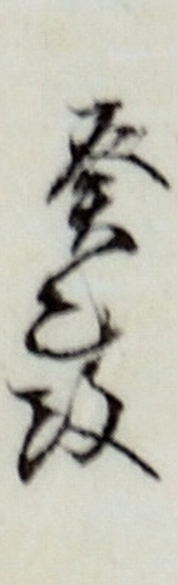癸巳改
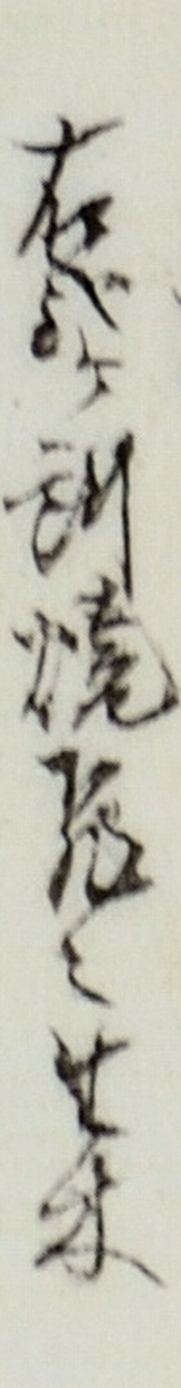右弐ケ所焼飛之生木
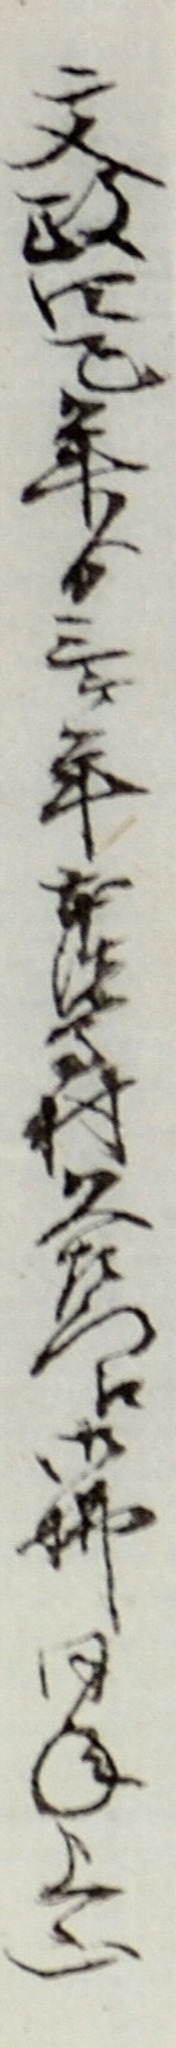文政四巳年ゟ三ケ年本洗馬村久左衛門え御払同年上山

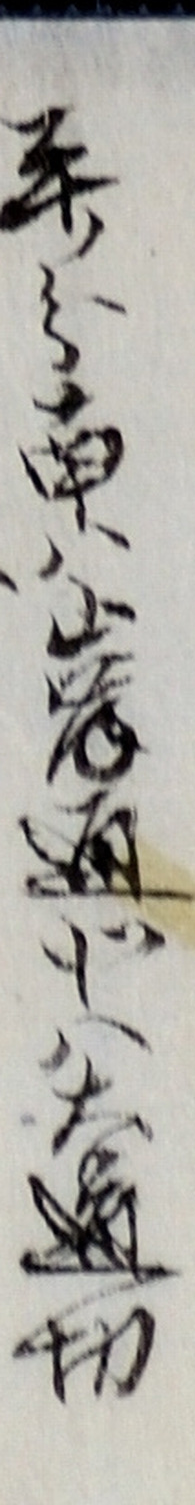平ノ分南は山峯通北は大通切
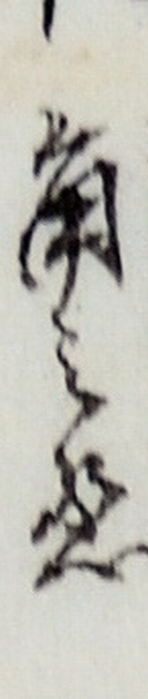角之丞
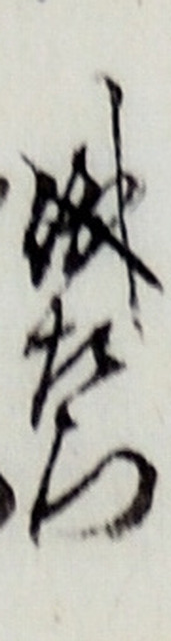武左衛門
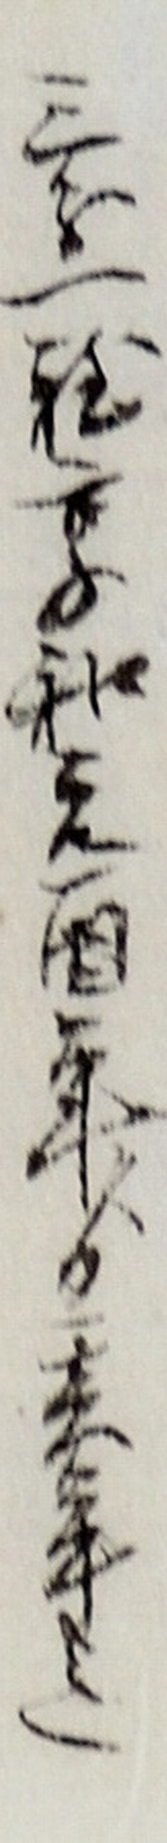三分一程享和元酉年ゟ亥年迄
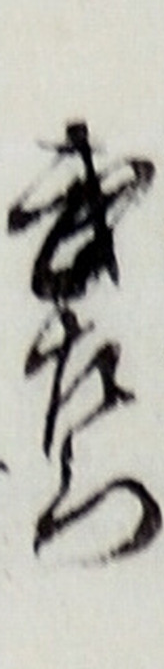武左衛門
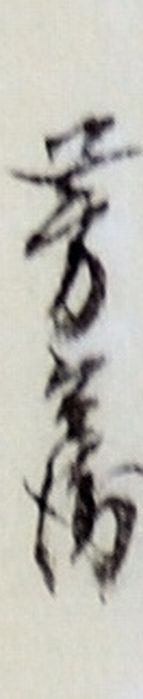芳兵衛
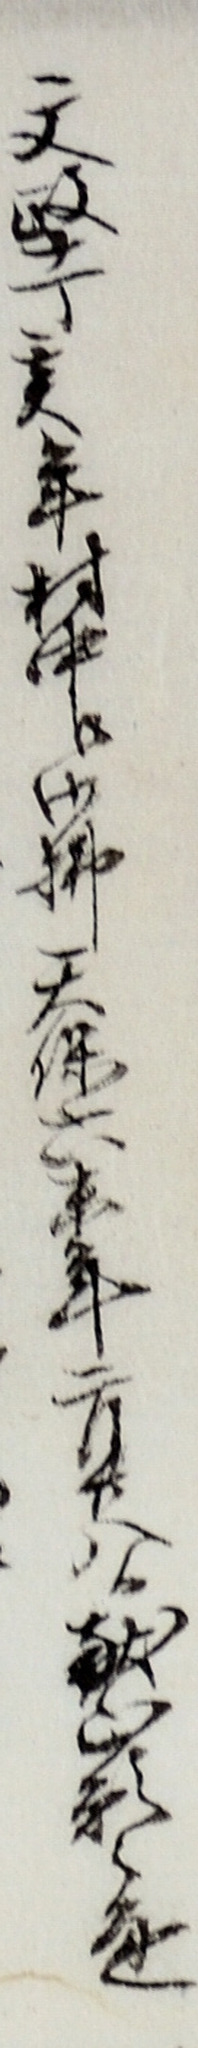文政十丁亥年村中え御払天保六未年二月廿八日献山願之通
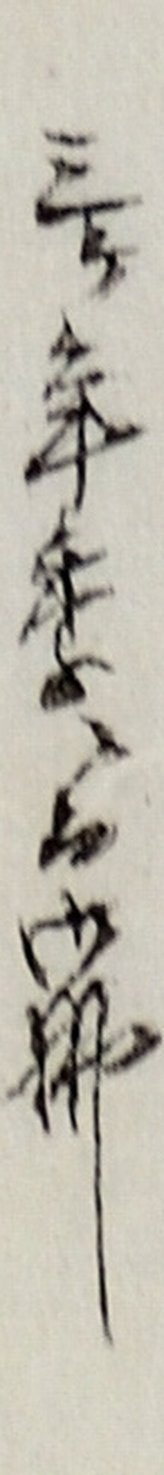三ケ年季ニ而御払
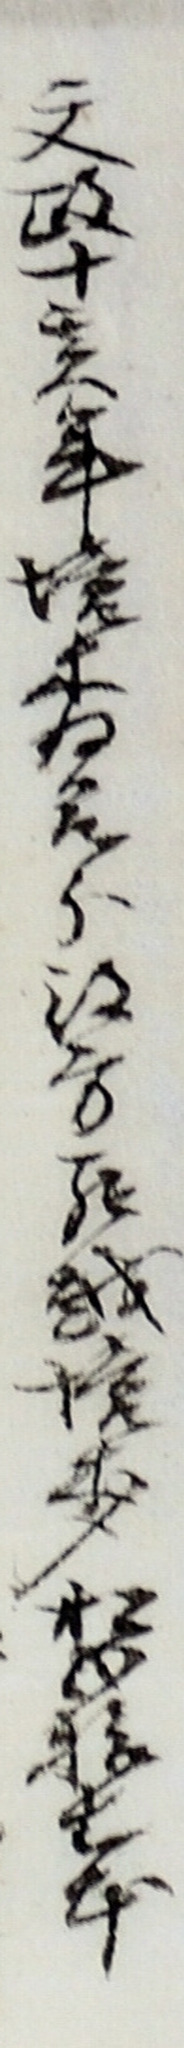文政十亥年境木為見分役方罷越境木〆松弐拾七本
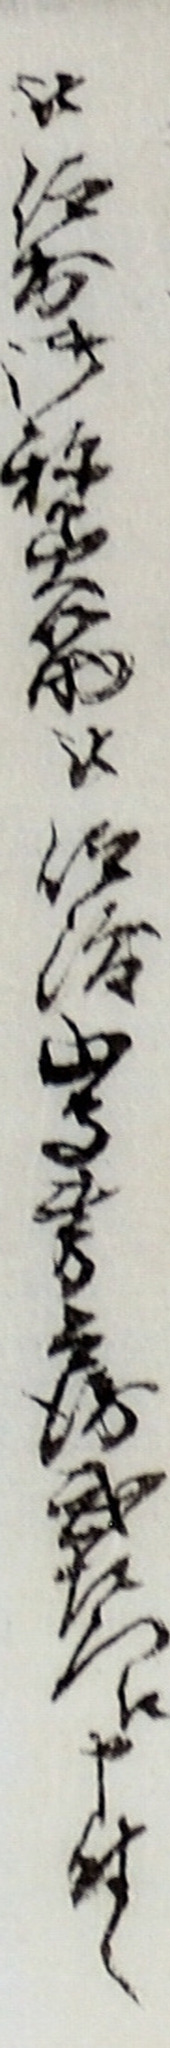被仰出御称美筋被仰渡山守芳兵衛武左衛門え申付候
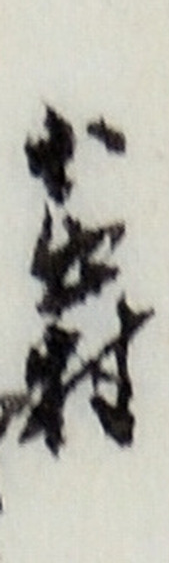小出村
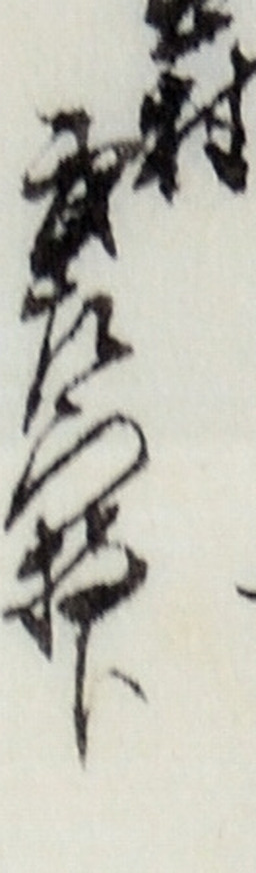武左衛門持分
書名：山林帳草稿
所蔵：伊那市立高遠町図書館・合同会社AMANE
